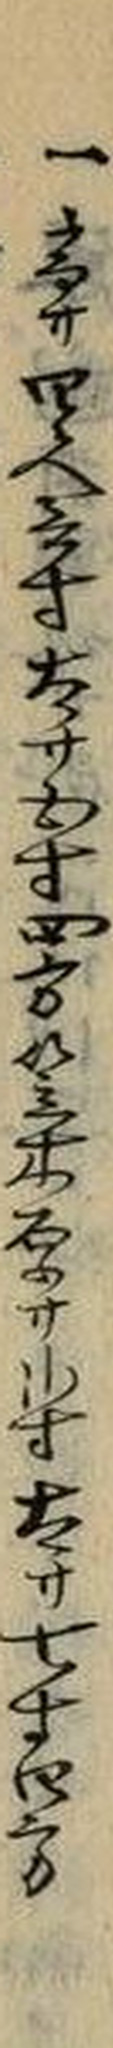一高サ四尺壱寸太サ五寸四方笠木厚サ弐寸太サ七寸四方
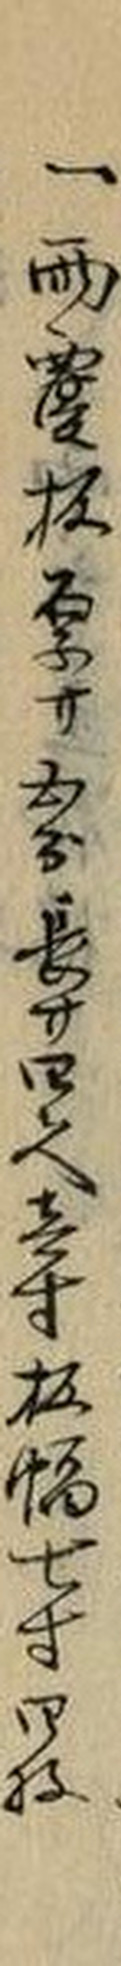一雨覆板厚サ五分長サ四尺壱寸板幅七寸四枚
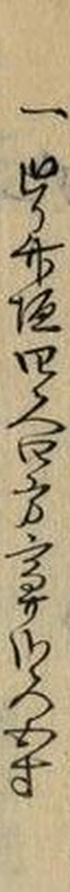一廻り竹垣四尺四方高サ弐尺五寸
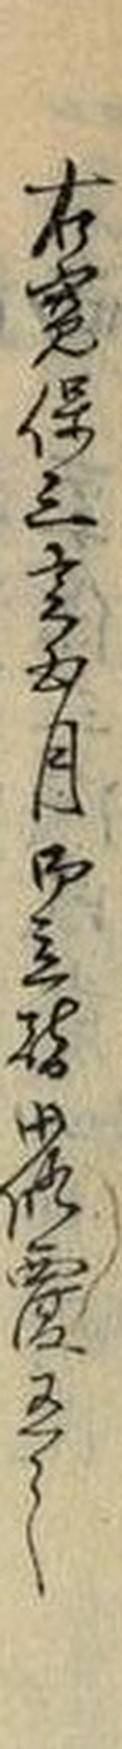右寛保三亥五月御立替御修覆有之
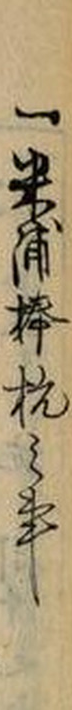一米浦棒杭之事
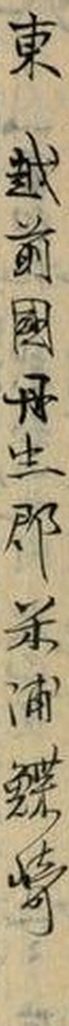東越前国丹生郡米浦鰈崎
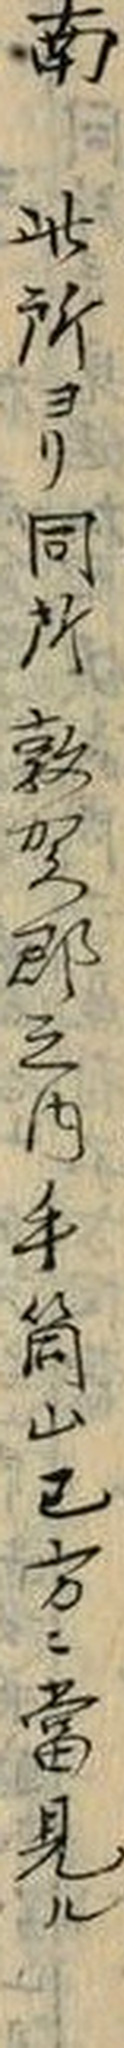南此所ヨリ同所敦賀郡之内手筒山巳方ニ当見ル
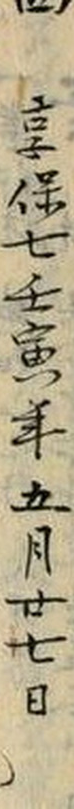西享保七壬寅年五月廿七日
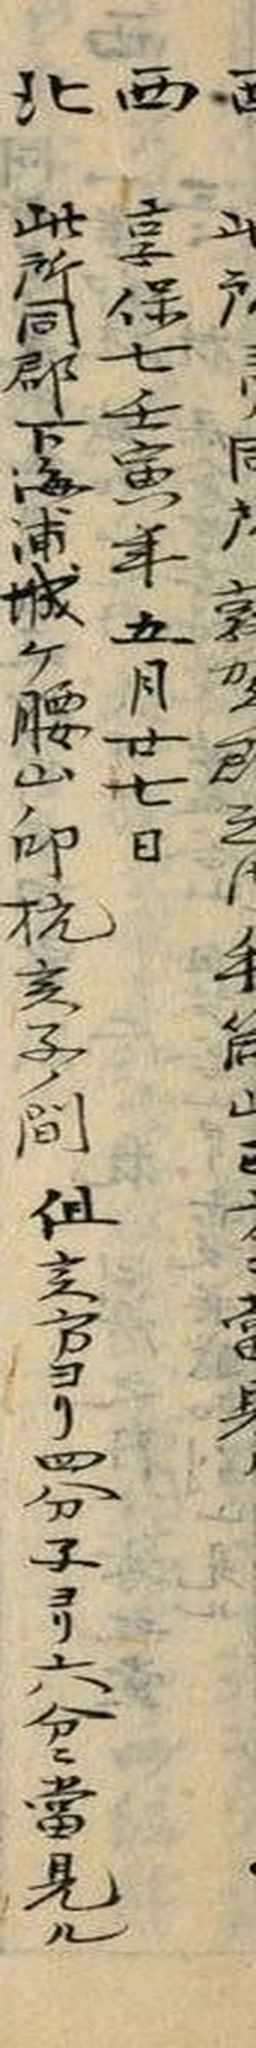北此所同郡下海浦城ケ腰山印杭亥子ノ間但亥方ヨリ四分子ヨリ六分ニ当見ル
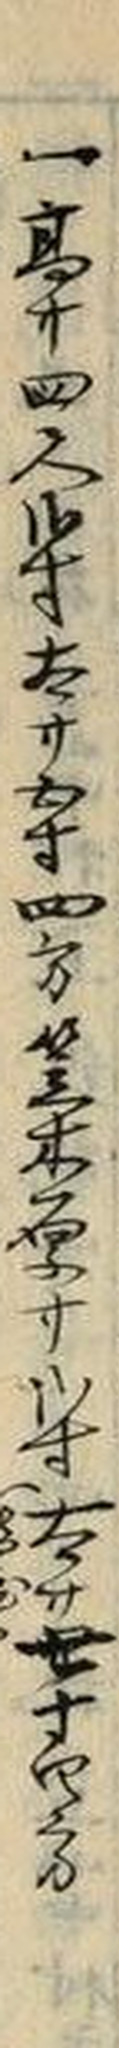一高サ四尺壱寸太サ五寸四方笠木厚サ弐寸太サ七寸四方
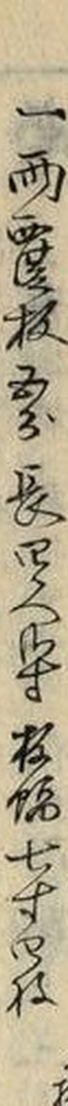一雨覆板五分長四尺弐寸板幅七寸四枚
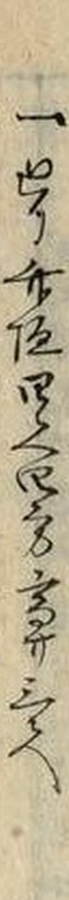一廻り竹垣四尺四方高サ三尺
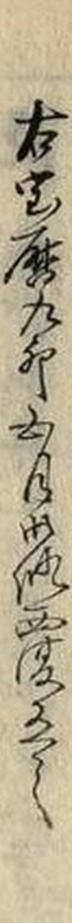右宝暦九卯五月御修覆有之
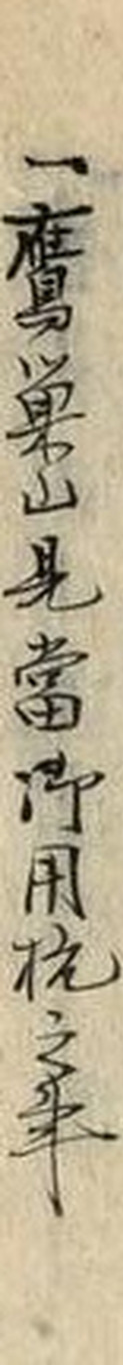一鷹巣山見当御用杭之事
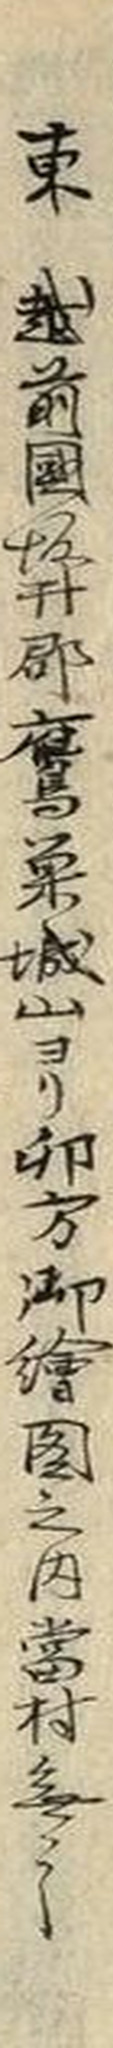東越前国坂井郡鷹巣城山ヨリ卯方御絵図之内当村無之
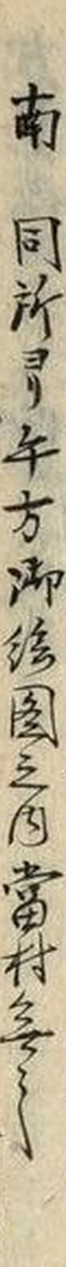南同所ヨリ午方御絵図之内当村無之
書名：御国他国諸事之部
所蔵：福井県文書館 Fukui Prefectural Archives
